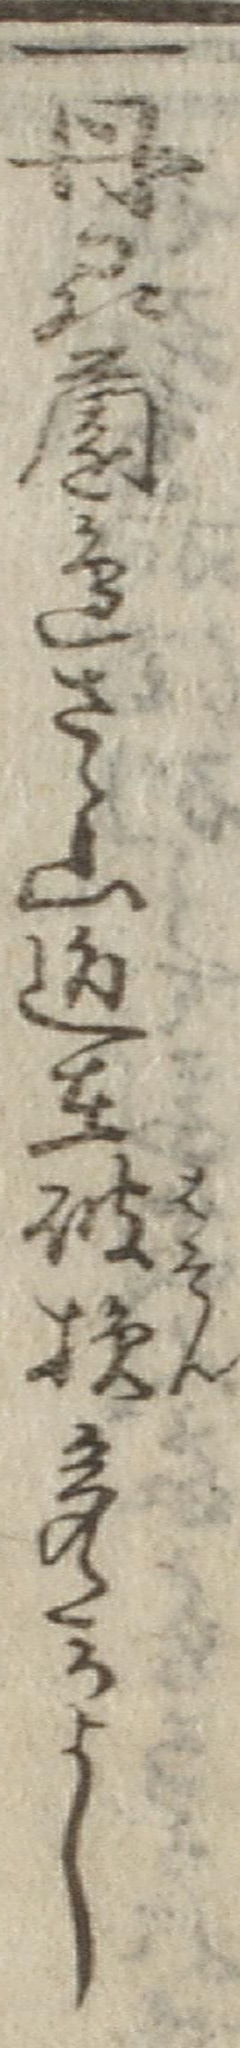一丹州薗辺さゝ山近在破損多く候よし
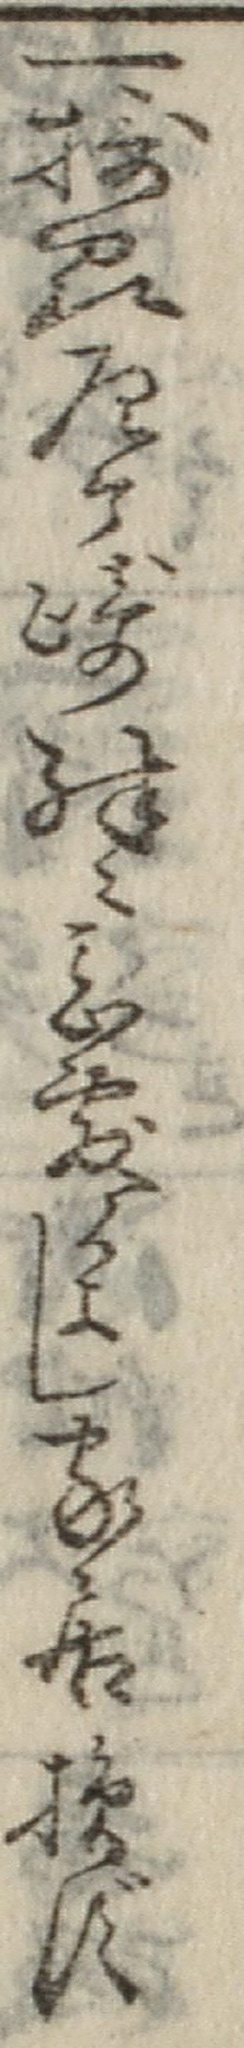一摂州尼ケ崎殊ニ甚敷候よし家居損ず
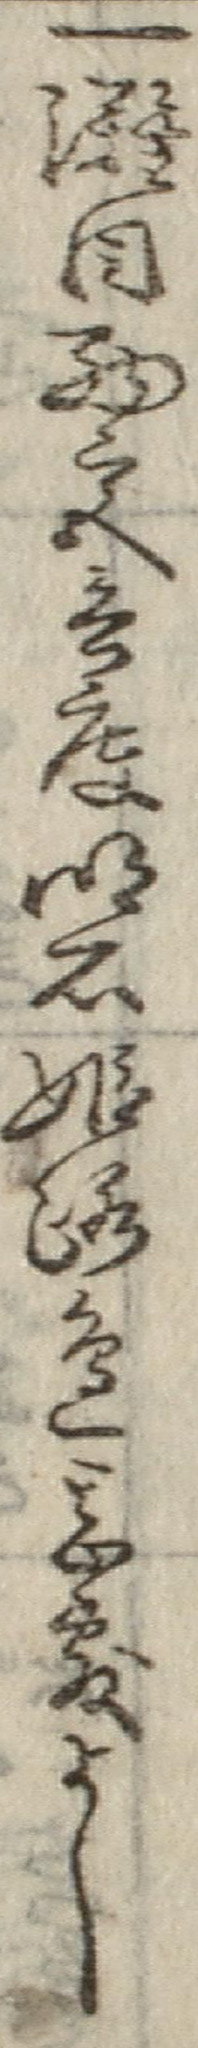一灘目西宮兵庫明石姫路辺甚敷よし
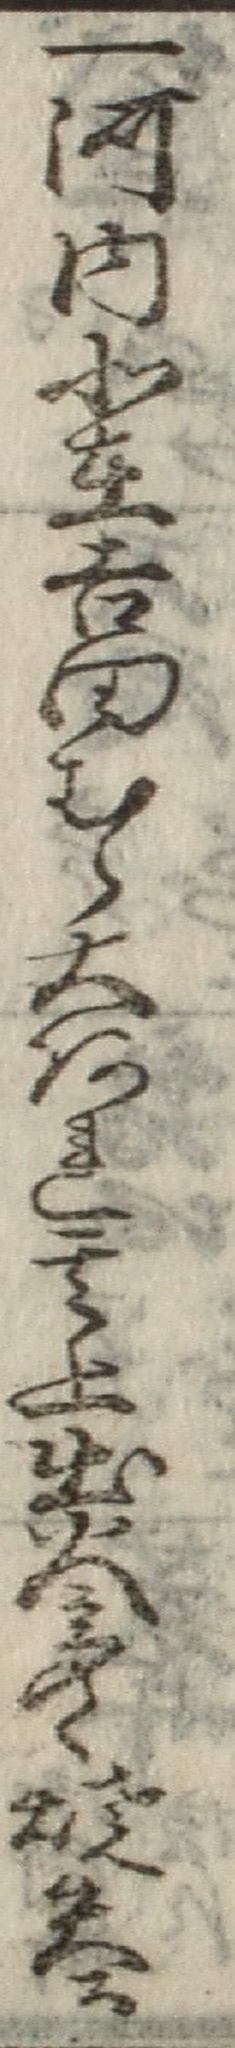一河内北在吉田むら大あれ其上出火多く焼失候
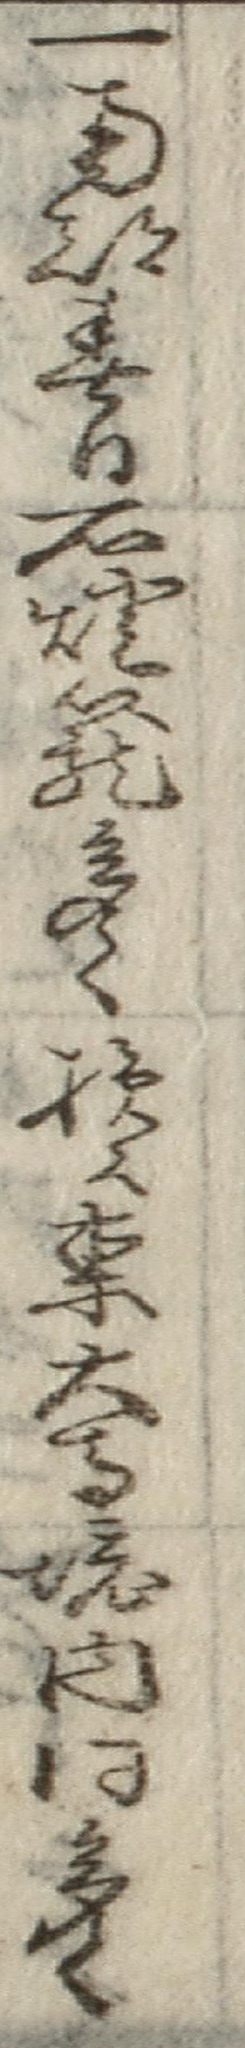一南都春日石燈籠多く損す東大寺境内同多く
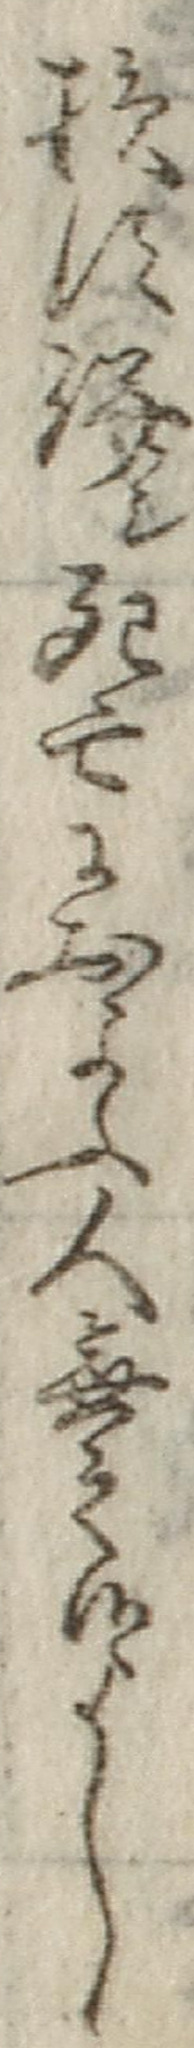損す併シ死亡におよふ人無之候よし
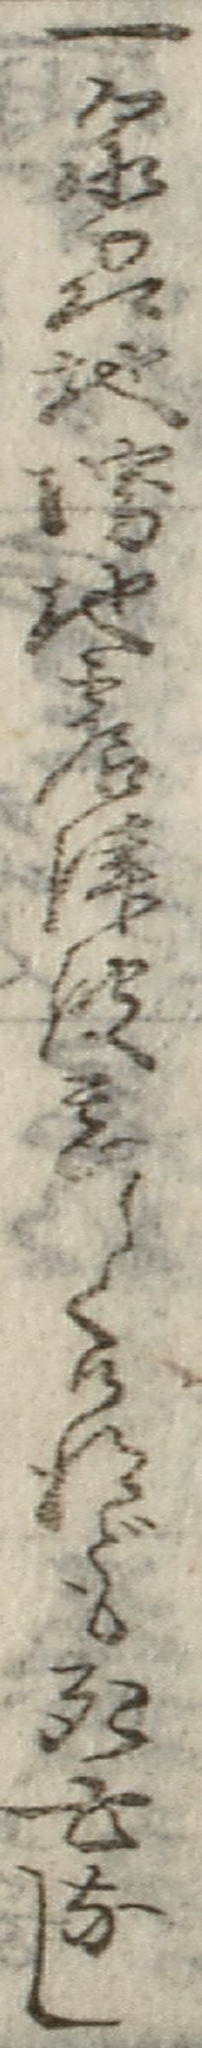一泉州地堺地震津波甚しく候得ども死亡なし
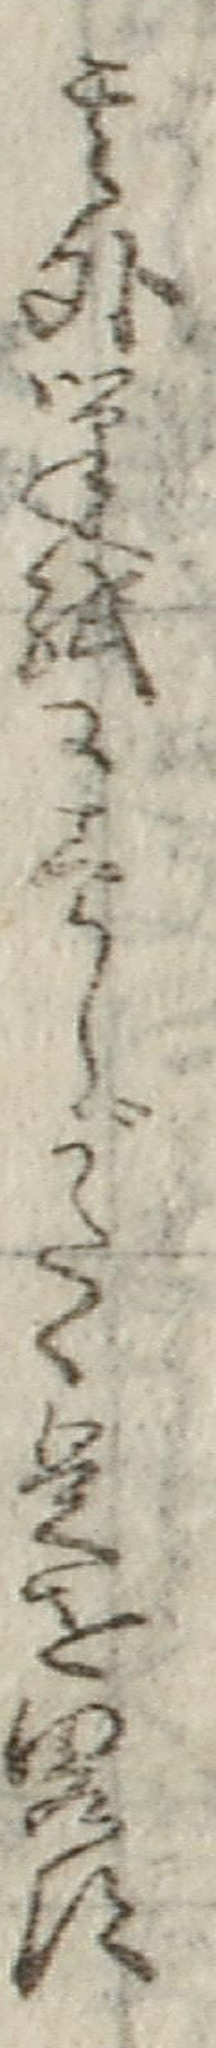其外筆紙に尽くしがたく是を略す
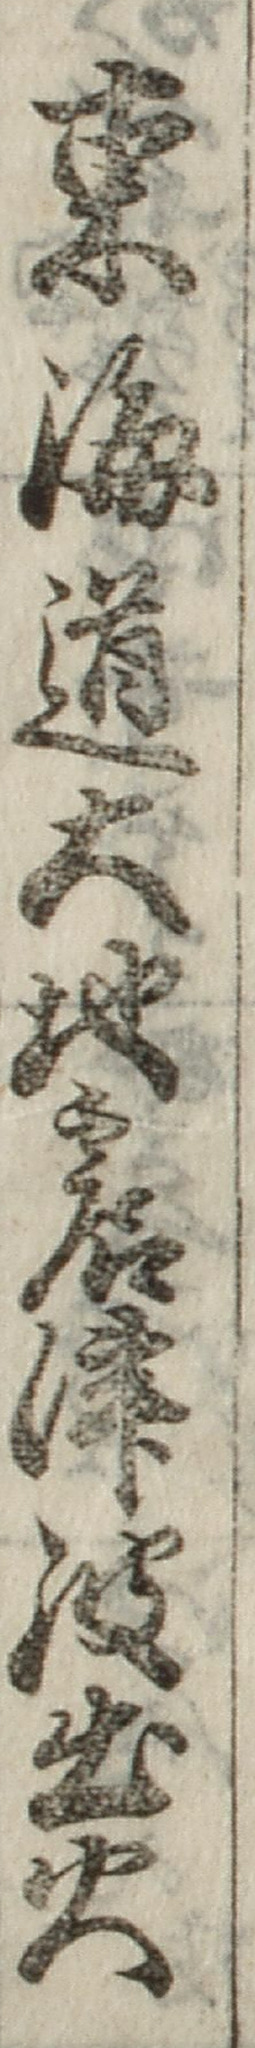東海道大地震津波出火

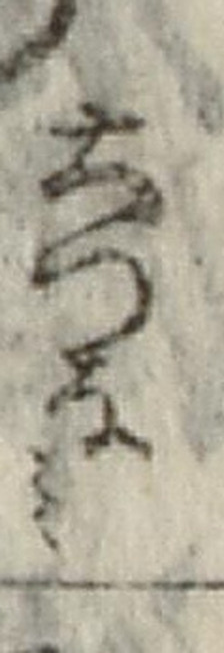大つなミ
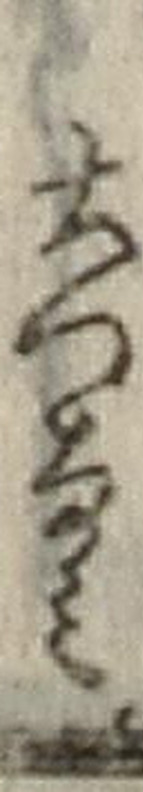大つなミ
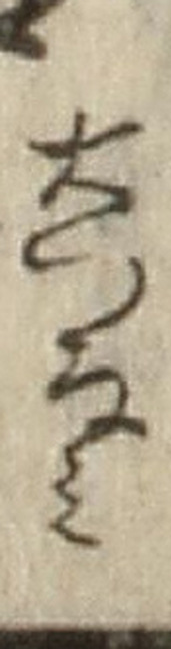大つなミ
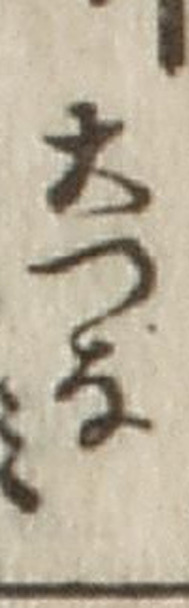大つなミ
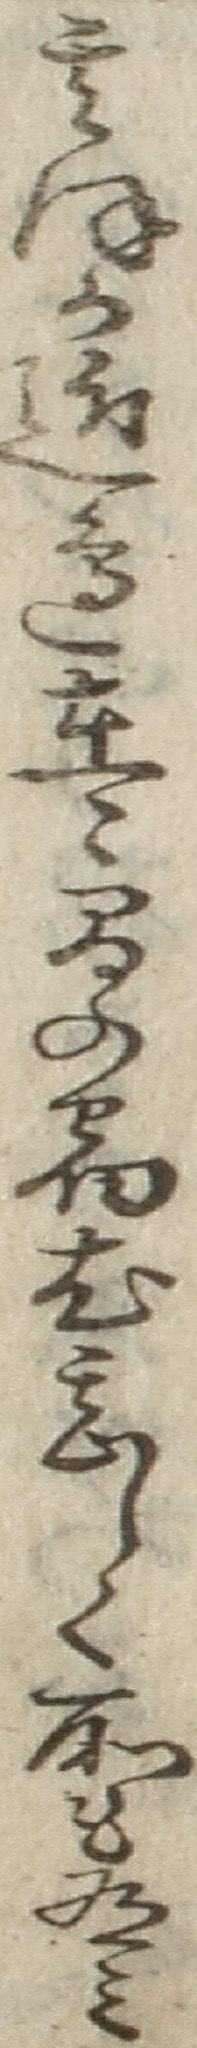其ほか近辺在〻間の宿尤甚しく所も有之
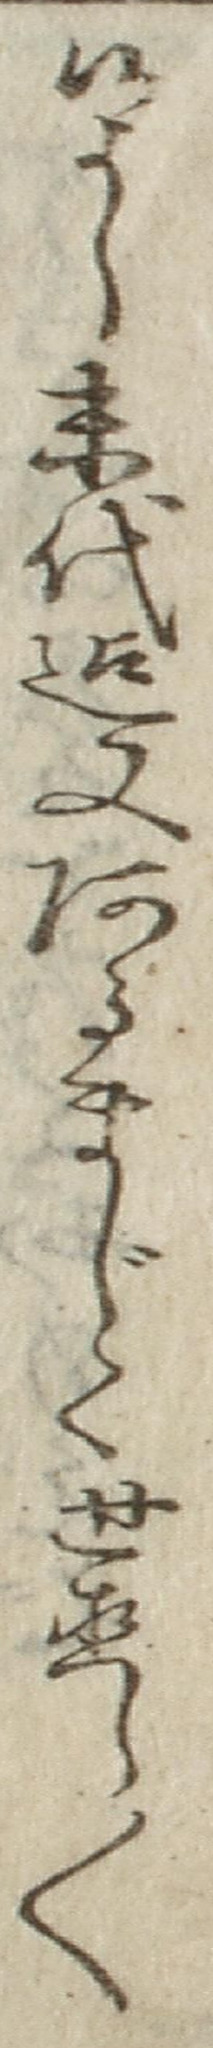候よし末代迄又あるまじく世直し〳〵
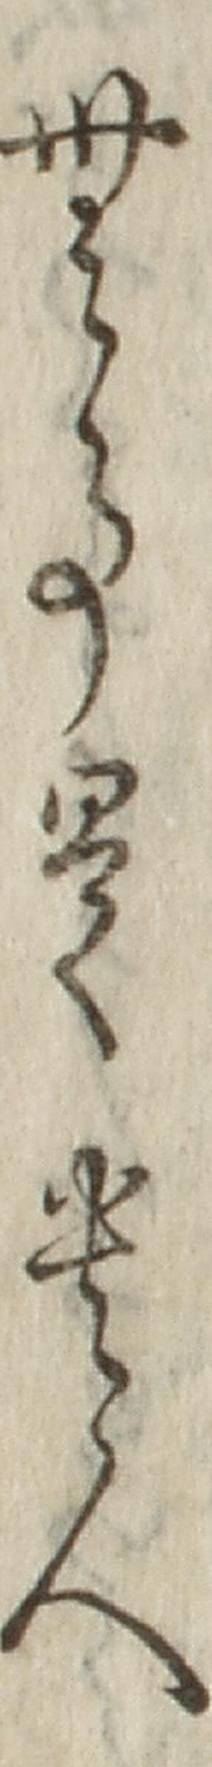無事是貴人
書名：世直り艸紙
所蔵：東京大学地震研究所図書室 Earthquake Research Institute Library, The University of Tokyo, JAPAN
